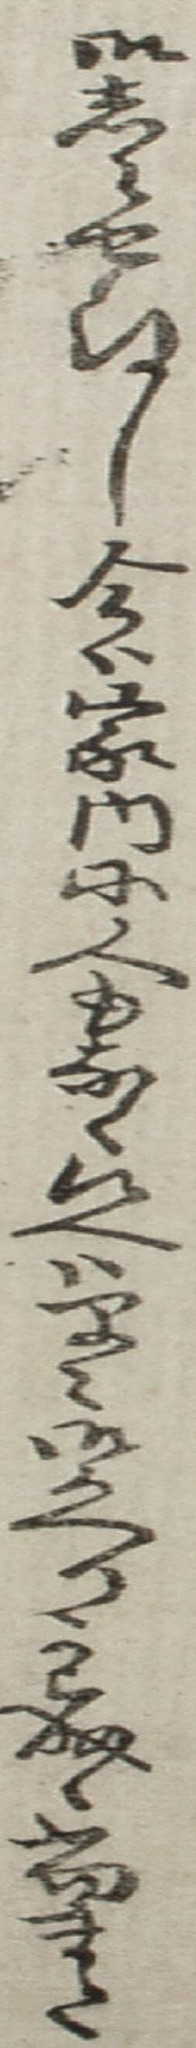御しらせまゐらせ候今は家内に人もなく候へは早々御かへり可被成候尚また
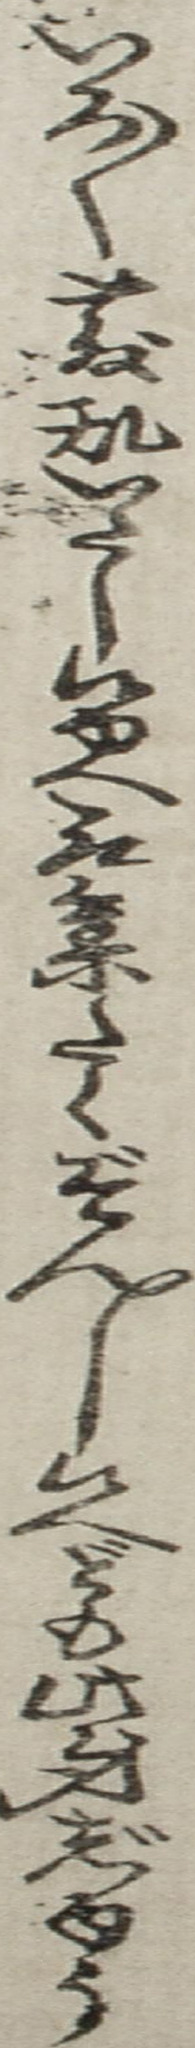いろ〳〵散乱いたし候ゆへ取集たくぞんし候へども此身じゆう
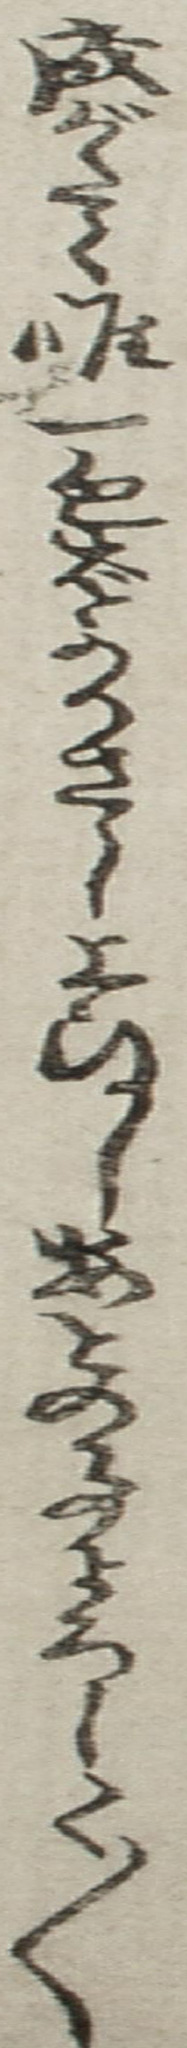成がたく唯一包ばかりさし上まゐらせ候あとの事よろしく〳〵
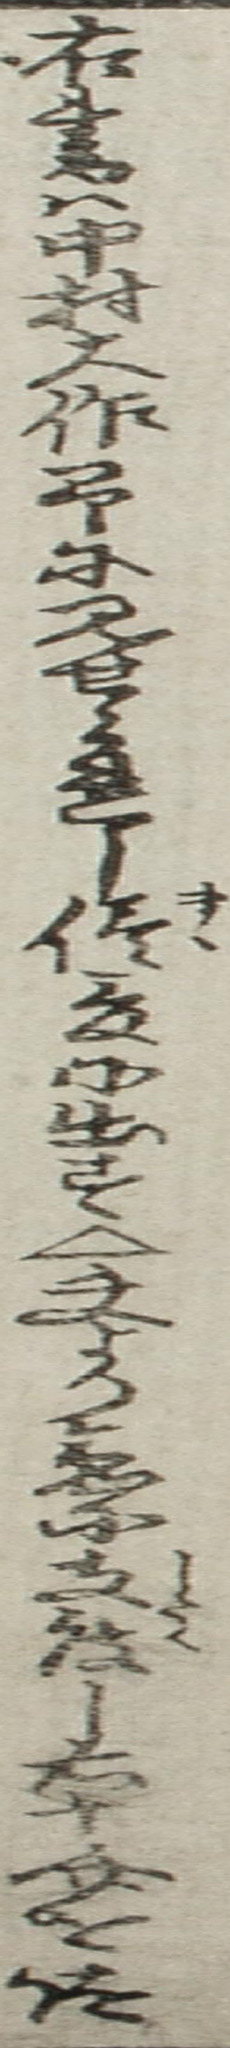右書は中村大作予に見せられし侭爰に出す△夫より急に支度し右十介を随
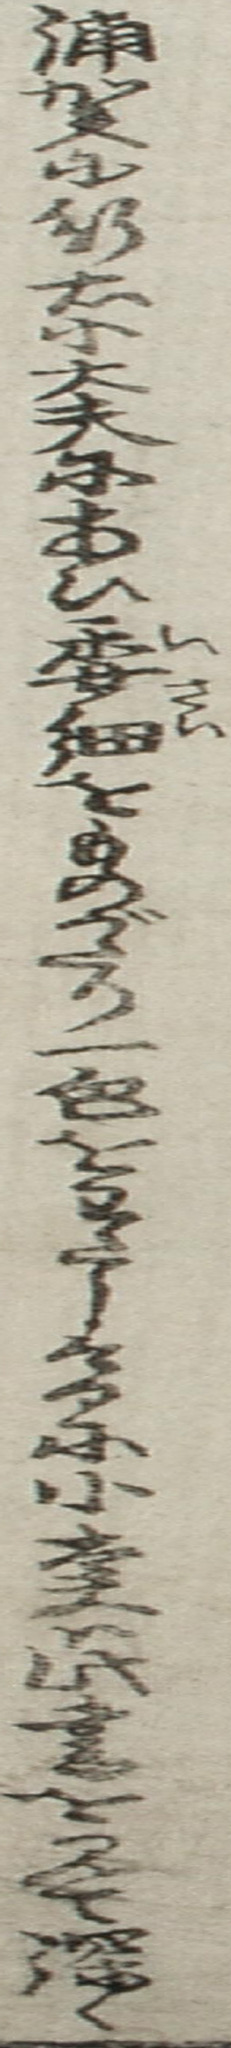浦賀に行右小太夫にあひ委細をものがたり一包をわたしけるに小太夫は此書を見て深く
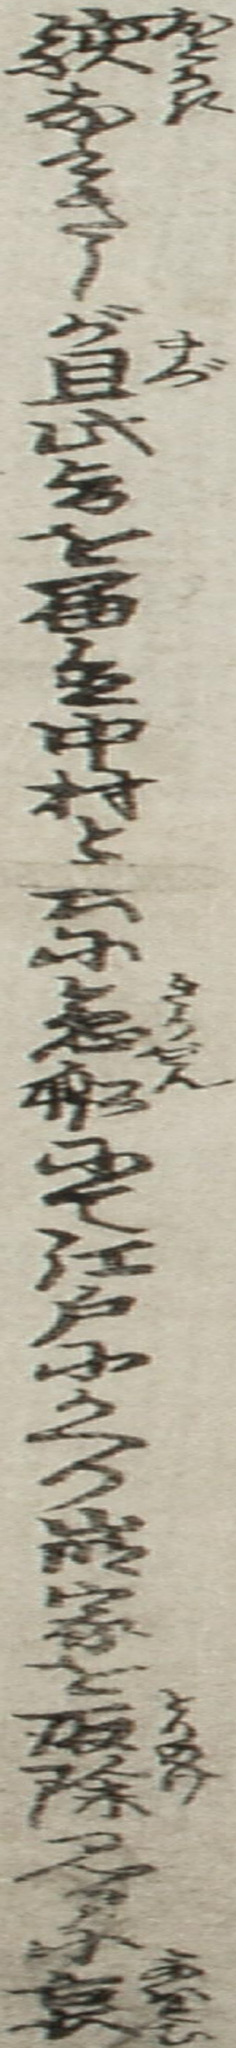駭なけきしが且此旨を届置中村と共に急船にて江戸にかへり崩家を取除見るに哀
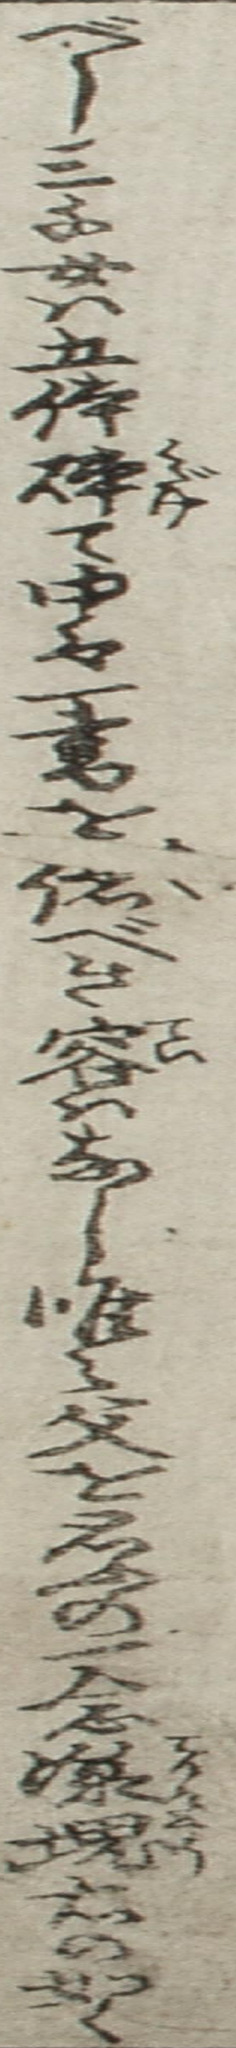べしみち女は五体砕て中々一書を認べき容はなし唯々父を思ふの一念凝塊右の如く
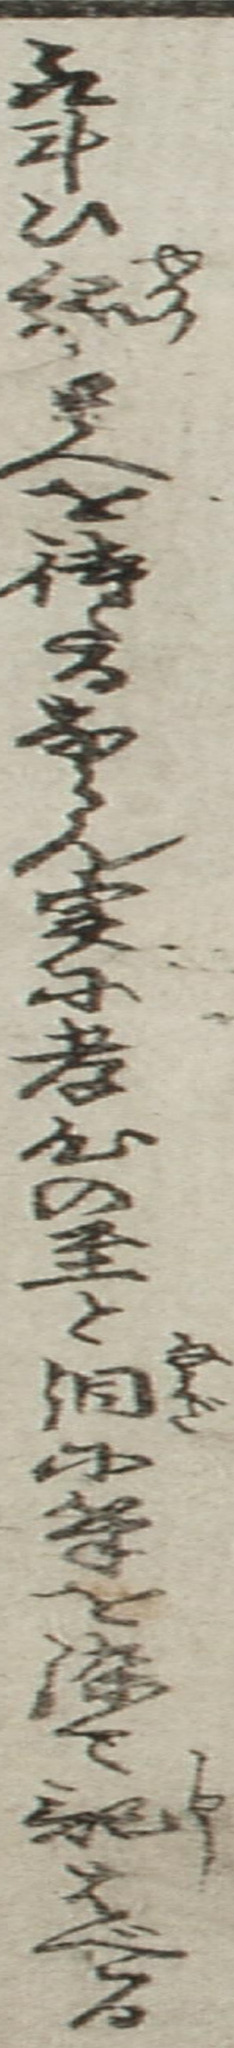取計ひ縁有人を待たるならん実に孝心の至と泪に筆を染て記はべる

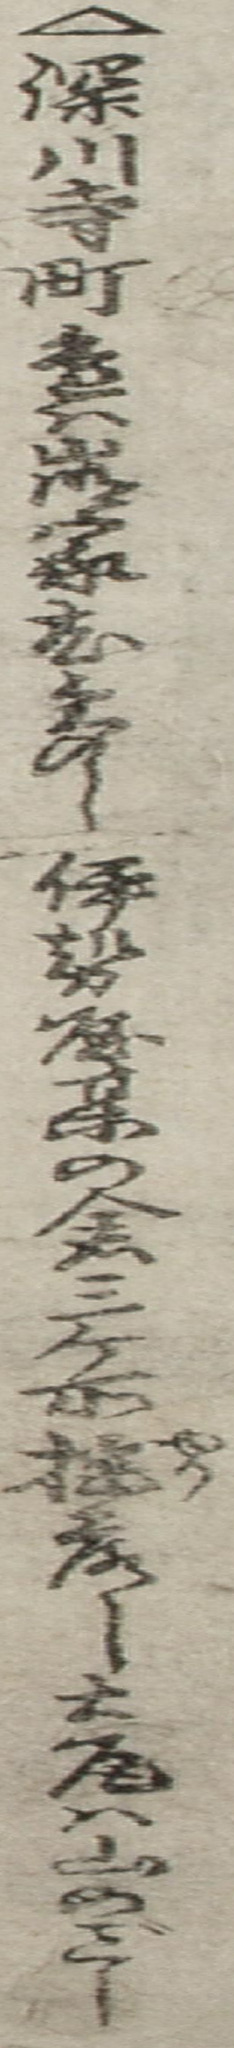△深川寺町辺は崩家尤多し伊勢屋某の倉三ヶ所揺落し土瓦は山のごとし
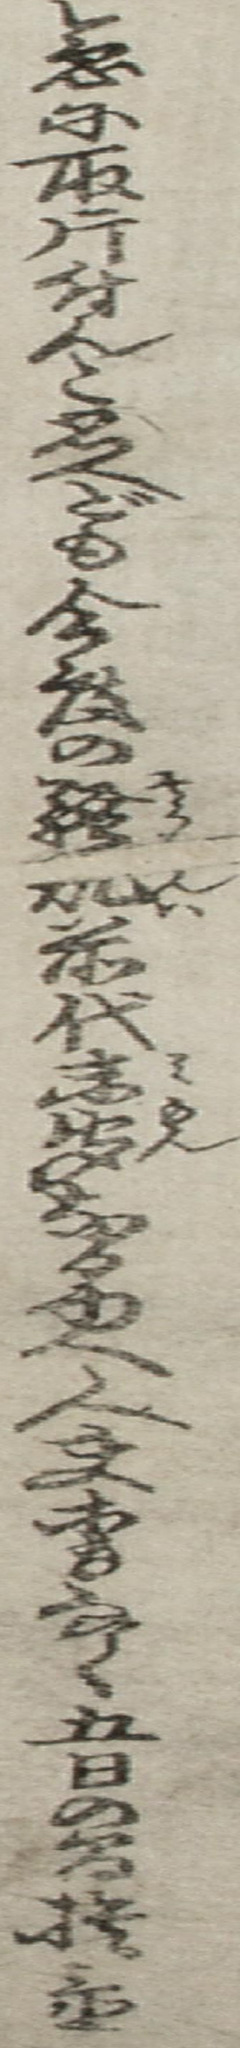急に取片付んと思へども今度の騒乱前代未聞なるゆへ人夫等もなく五日の間捨置
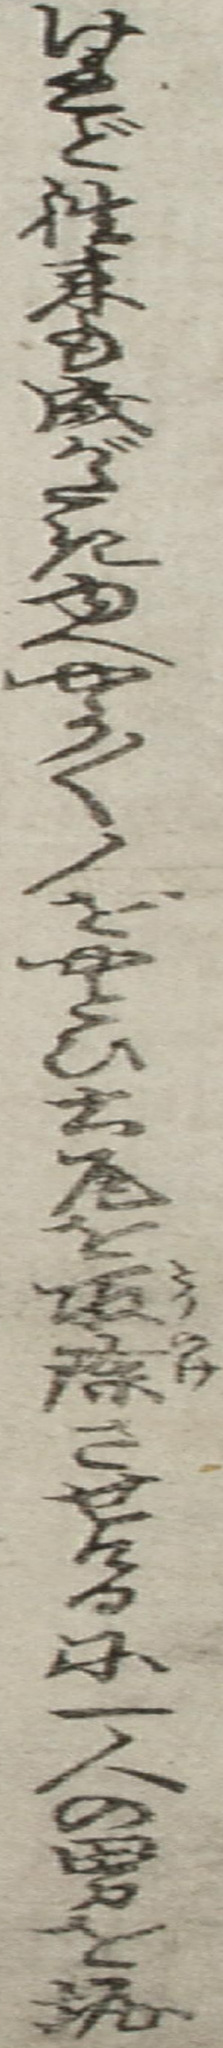けれど往来も成がたきゆへやう〳〵人をやとひ土瓦を取除させけるに一人の男を堀
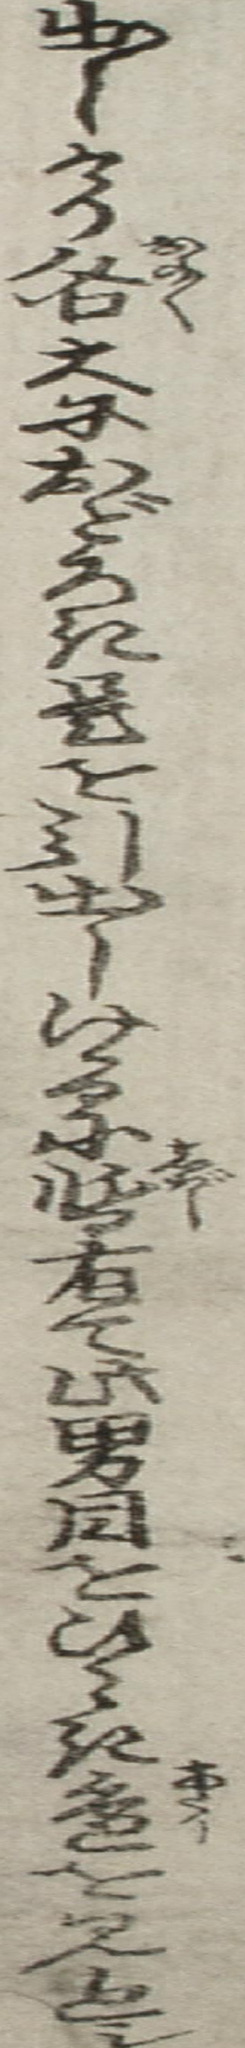出しけり各大におどろき是を引出しけるに暫有て此男目をひらき辺を見廻し
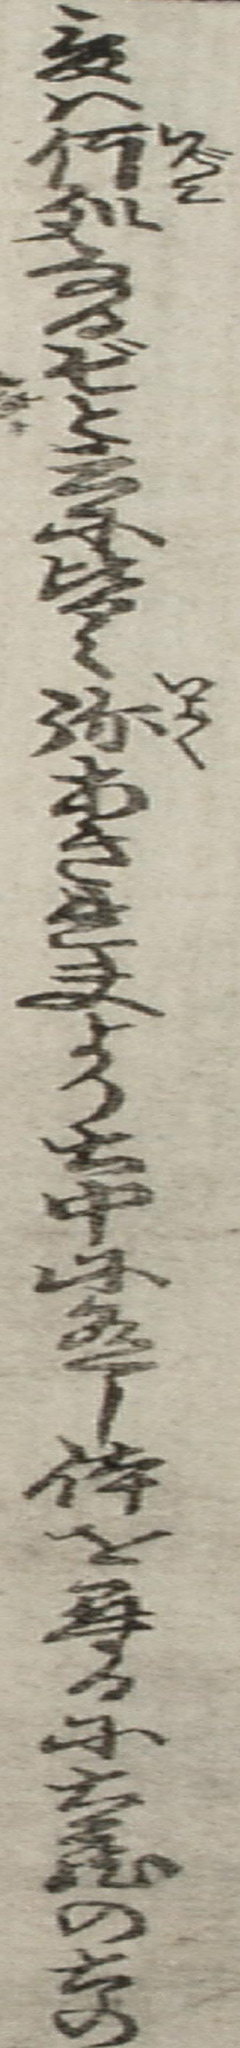爰は何処なるぞと云に皆々弥あきれ夫より土中に有し体を尋るに土蔵の土の
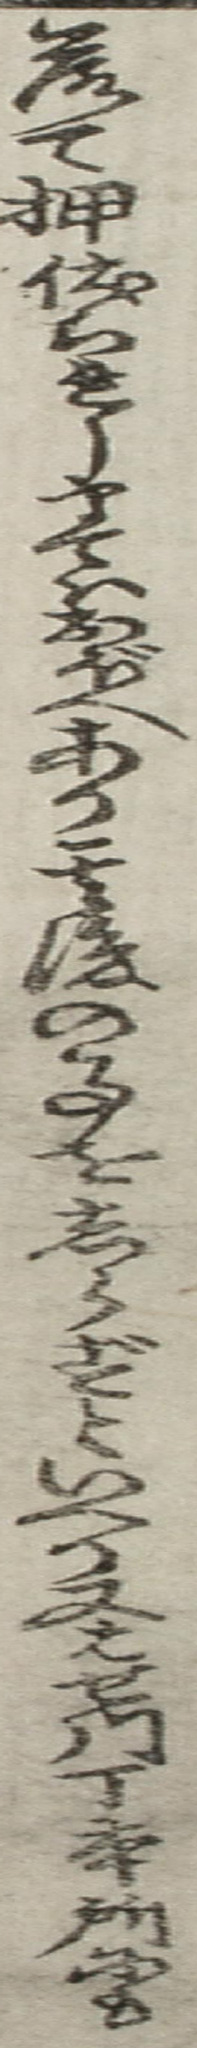落て押伏られしまてはおぼへあり其後の事をしらずといへり又はせ川丁本所にも
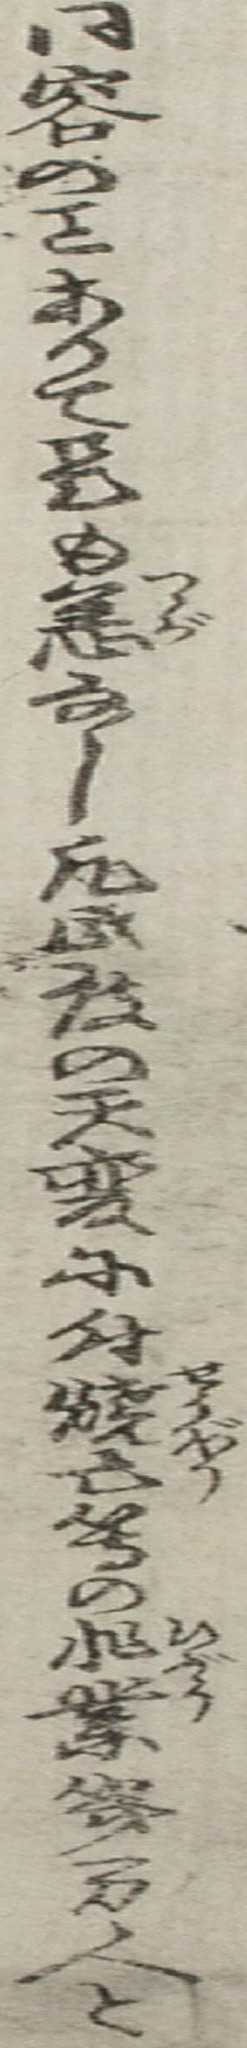同容のことありて是も恙なし凡此度の天変に付焼亡等の非業幾万人と
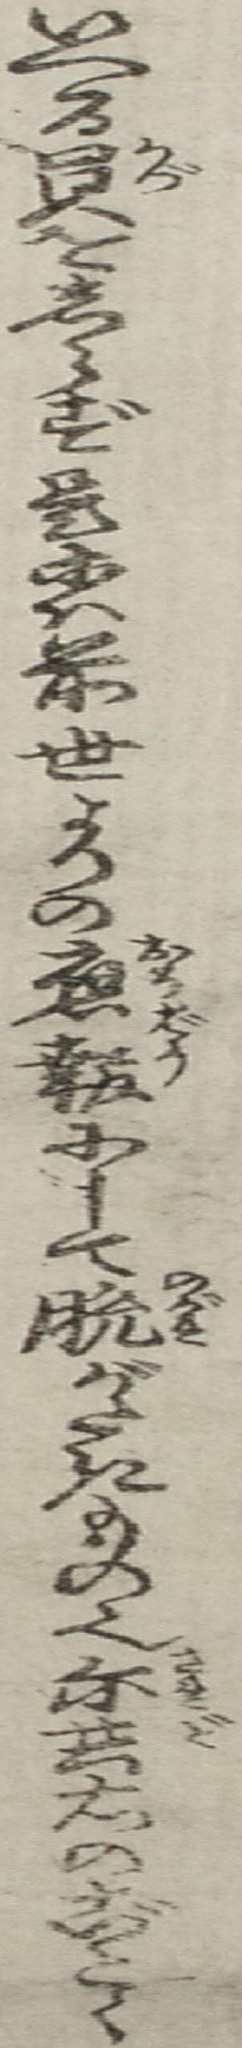いへる員をしらず是等は前世よりの応報にして脱がたきもの也尓共右のごとく
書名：安政見聞誌　下
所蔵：東京大学地震研究所図書室 Earthquake Research Institute Library, The University of Tokyo, JAPAN
